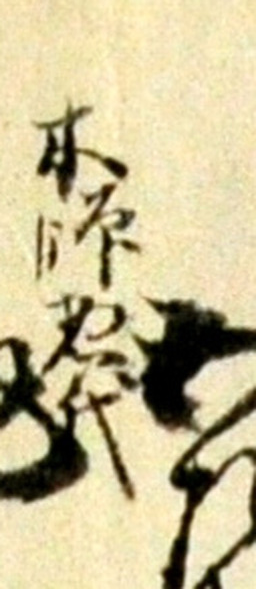木師惣代
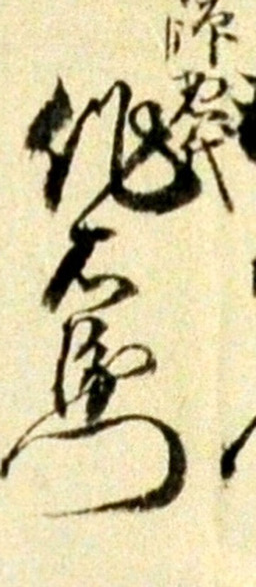作右衛門
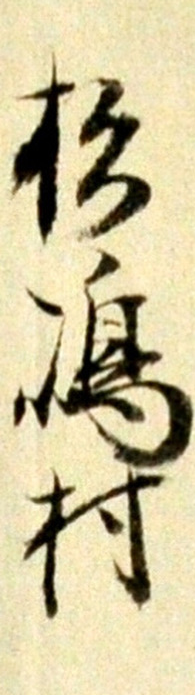杉嶋村
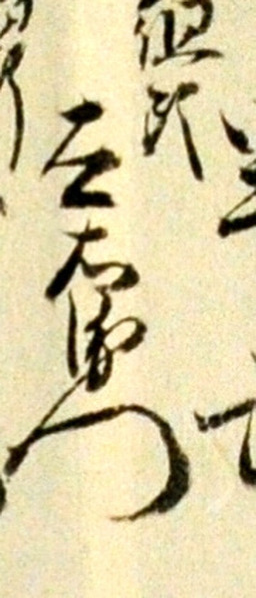太右衛門
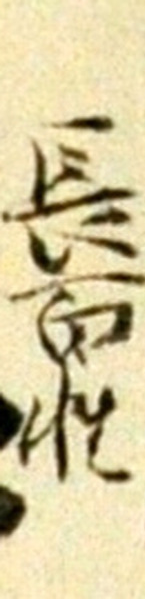長百性
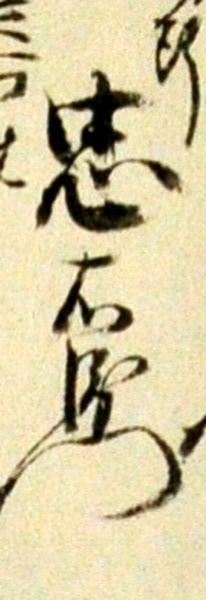忠右衛門
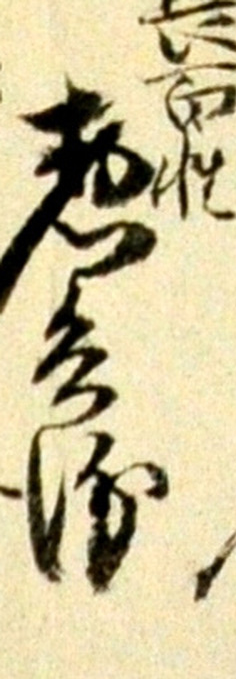惣兵衛
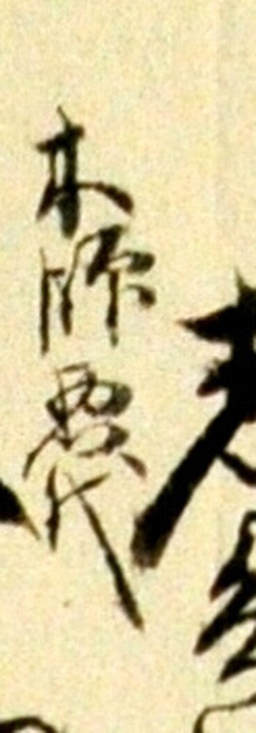木師惣代

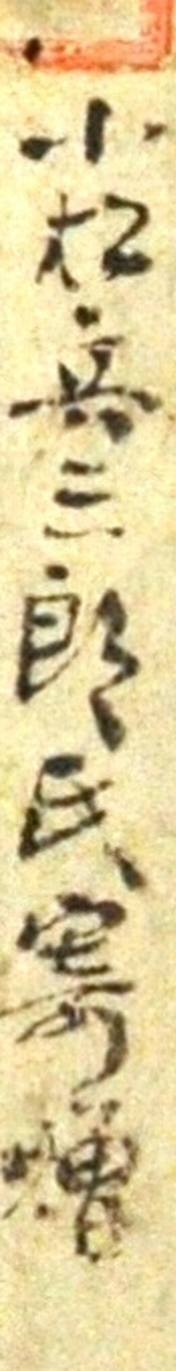小松兵三郎氏寄贈
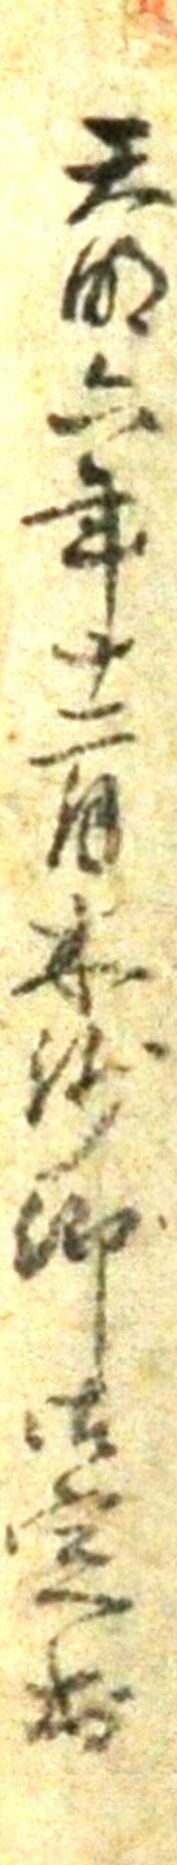天明六年十二月木師郷御定書
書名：木師郷御定書（写）
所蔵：伊那市立高遠町図書館・合同会社AMANE
